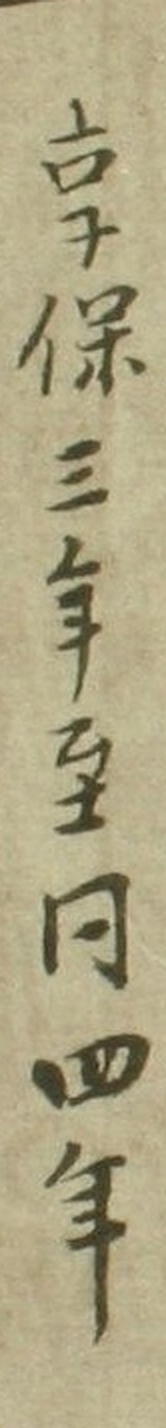享保三年至同四年

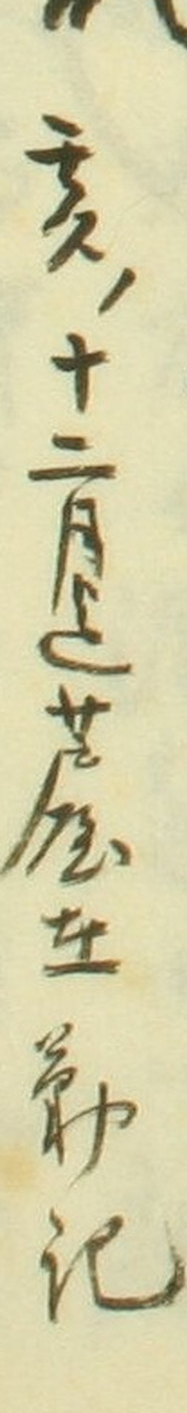亥の十二月迠芦屋在勤記

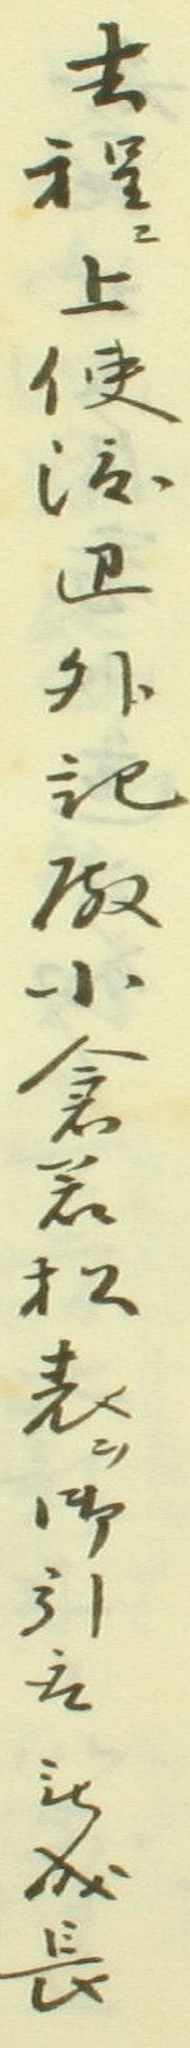去程に上使渡辺外記殿小倉若松表を御引取被成長
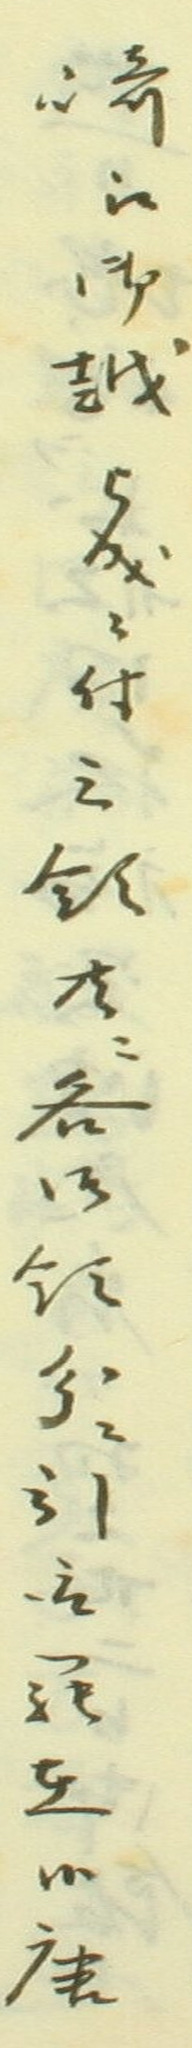崎江御越被成に付三領共に各御領分に引取罷在候唐
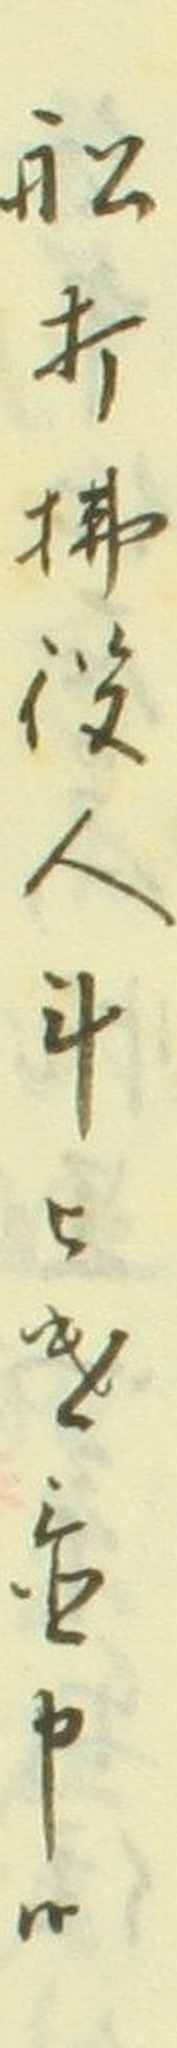船打払役人斗被遣置申候
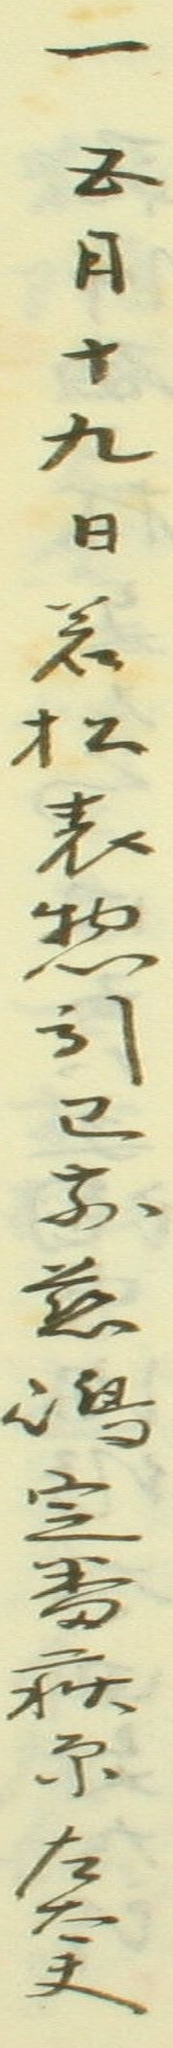一五月十九日若松表惣引已前慈嶋定番萩原左太夫
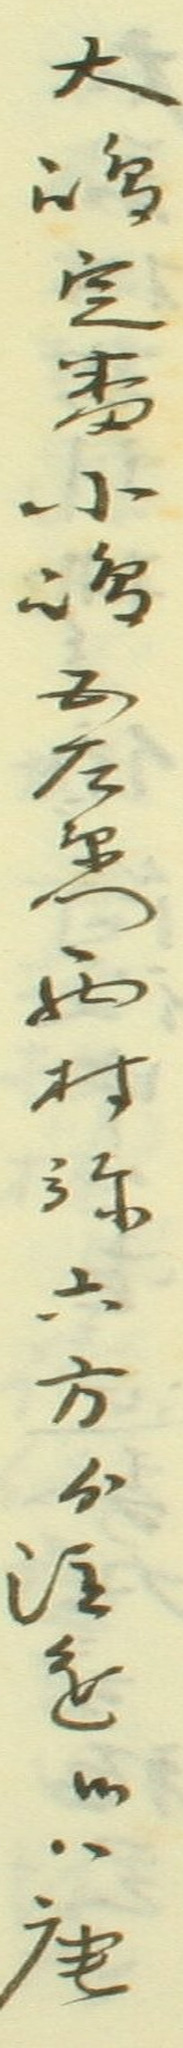大嶋定番小嶋五左衛門西村弥六方ゟ注進候は唐
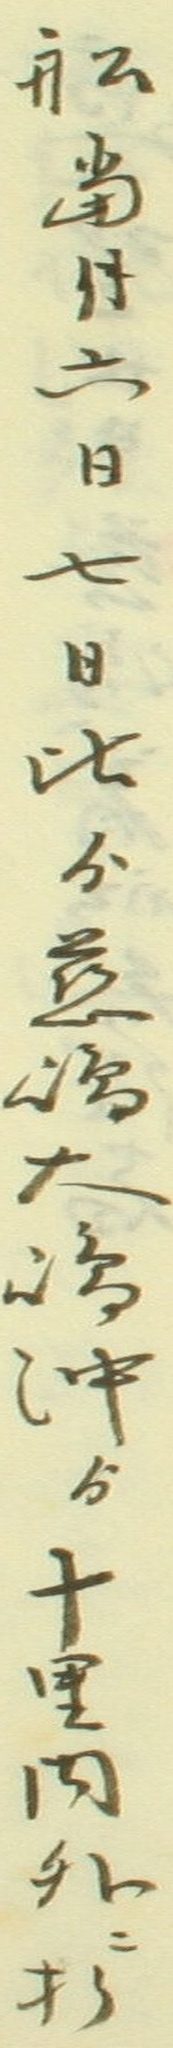船当月六日七日頃ゟ慈嶋大嶋沖ゟ十里内外に折
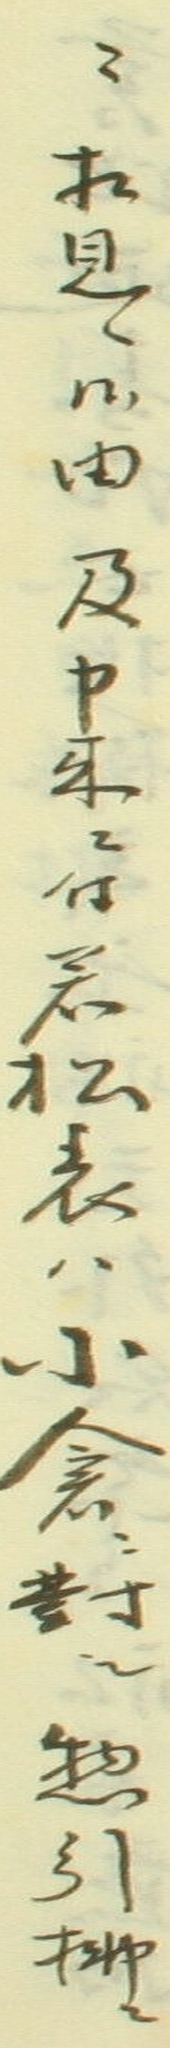々相見へ候由及申来に付若松表は小倉に対し惣引払に
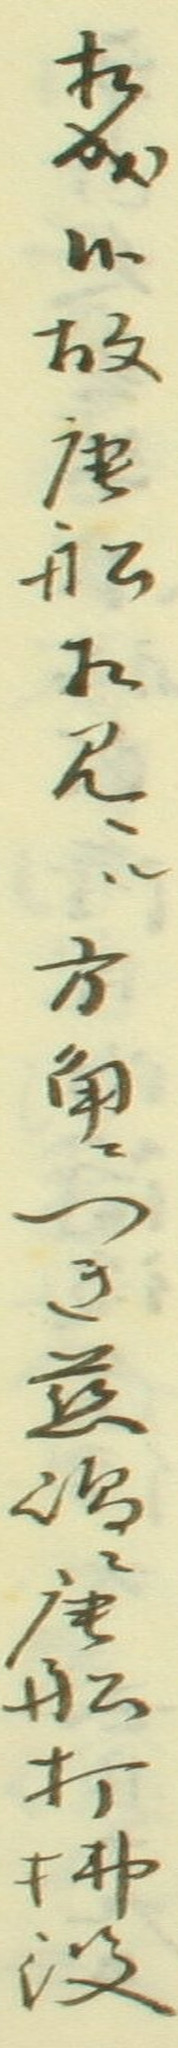相成候故唐船相見へる方角につき慈嶋に唐船打払役
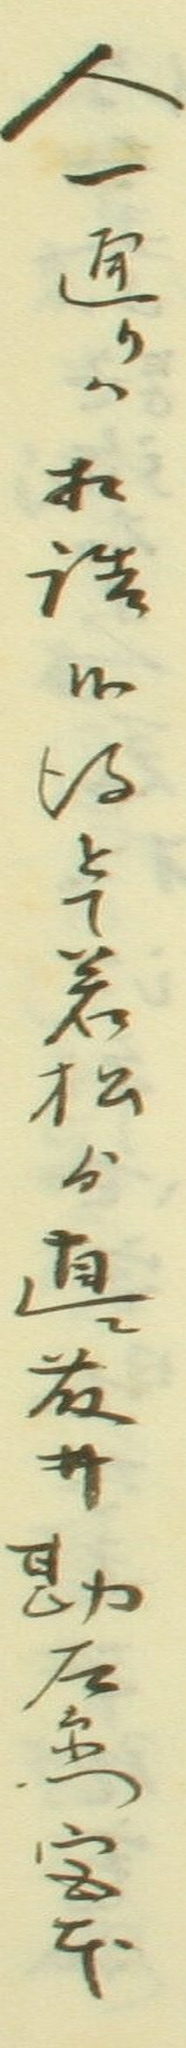人一通りは相詰候得とて若松ゟ直に藤井勘左衛門宮本

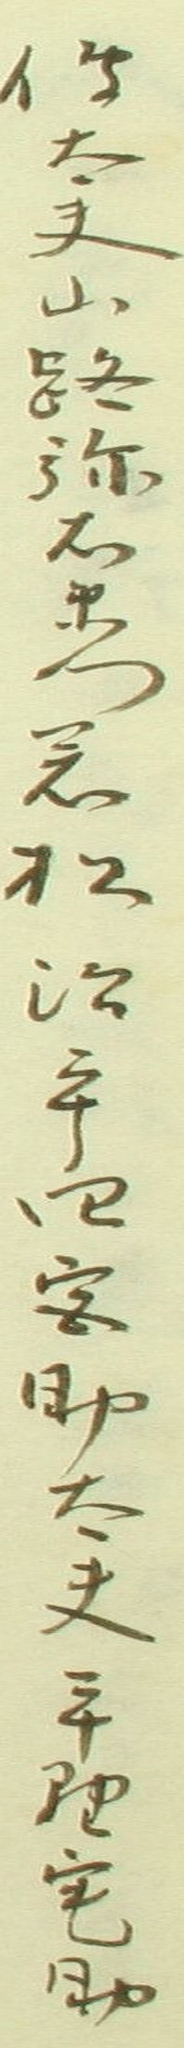伝太夫山路弥右衛門若松治平四宮助太夫平野宅助
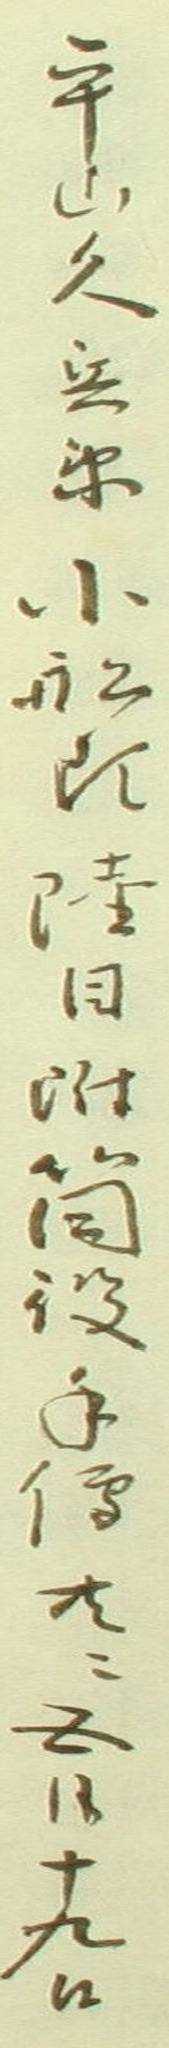平山久兵衛小船頭陸目附筒役手伝共に五月十九日
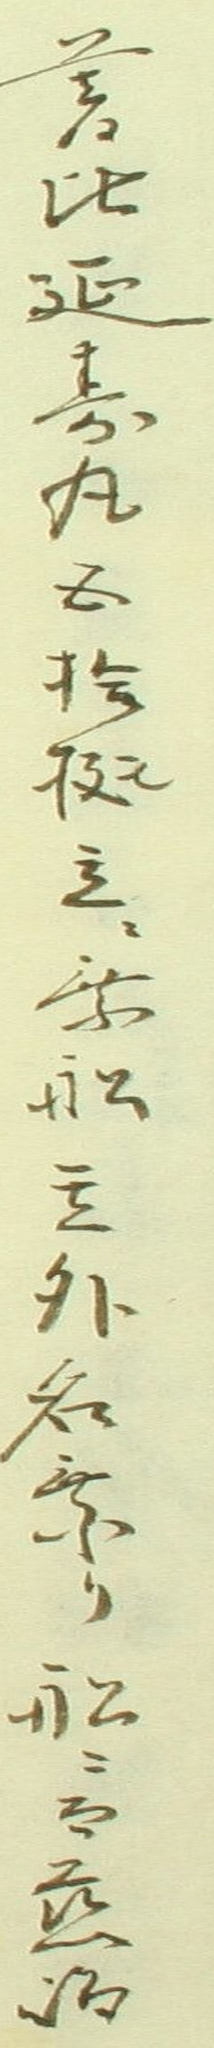暮頃延寿丸五拾挺立に乗船其外名乗り船に而慈嶋
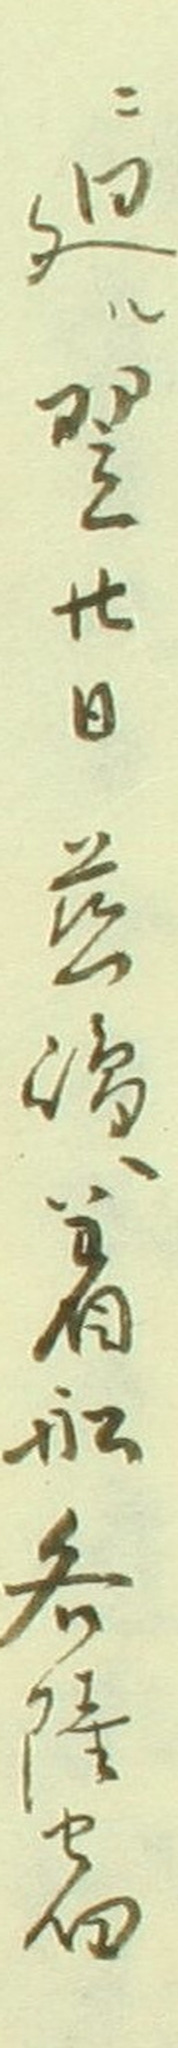に廻る翌廿日慈嶋へ着船各陸宿
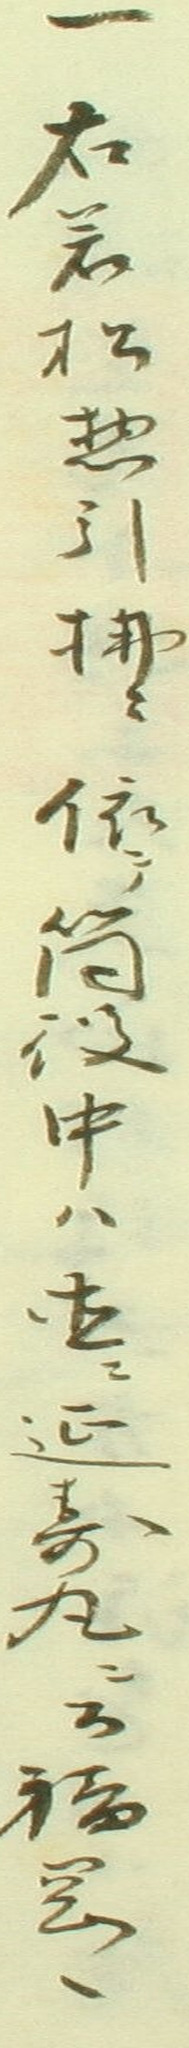一右若松惣引払に依て筒役中は直に延寿丸に而福岡へ
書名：唐船漂流記 三
